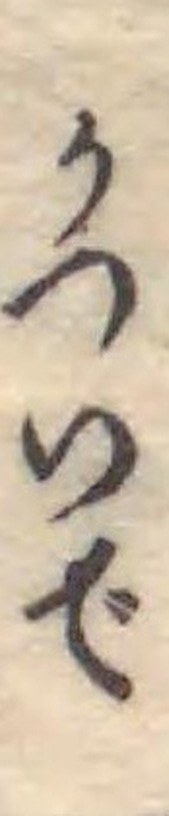かついで
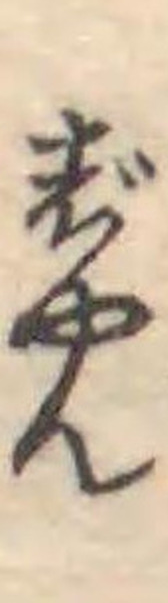じやん

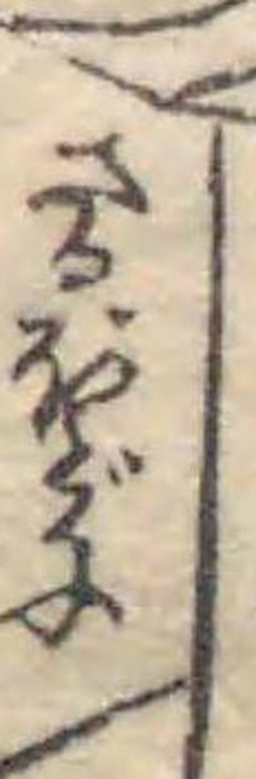さるほどに
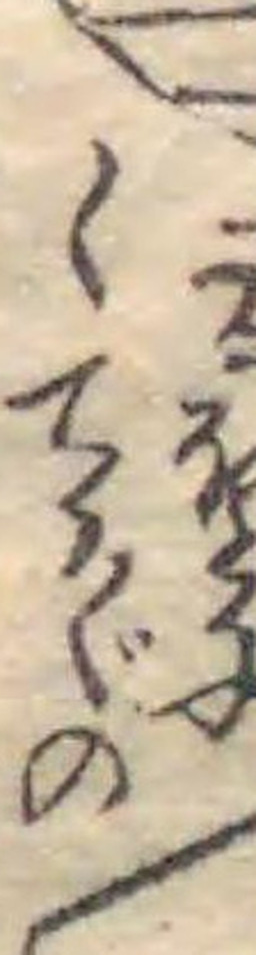してかぐの
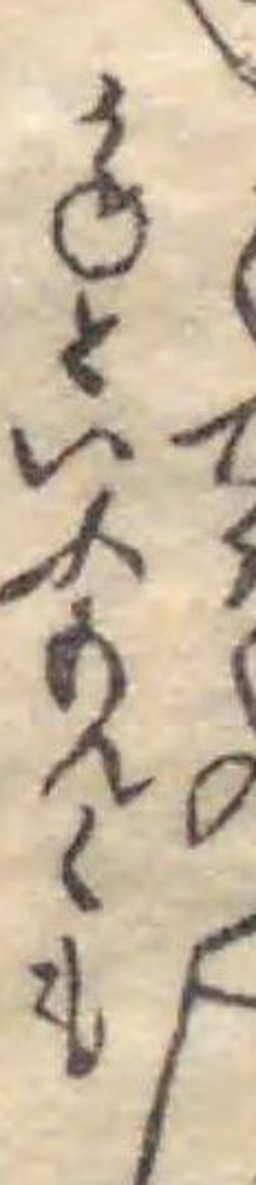かねといふもんくも
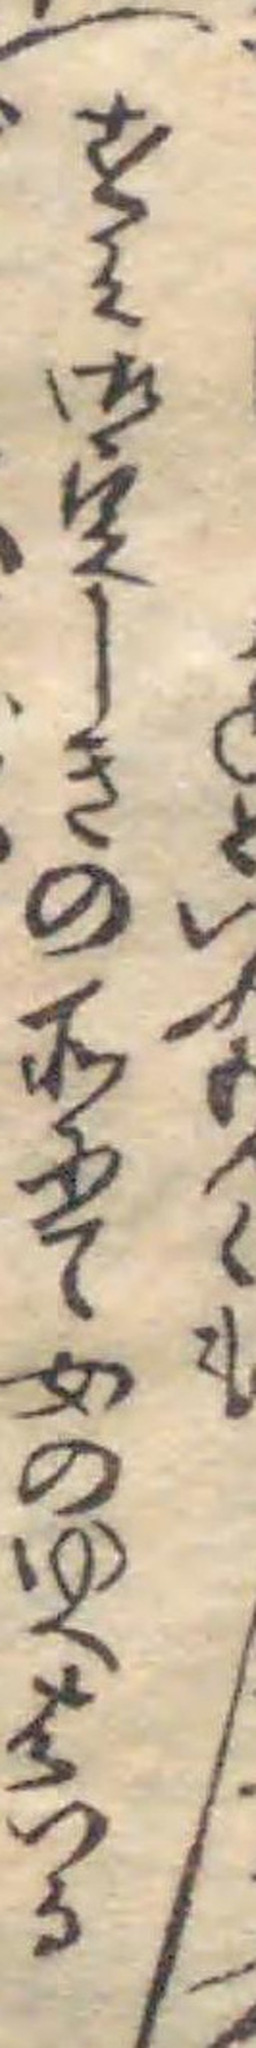すみ御定しきの所にて女のゆへはいる
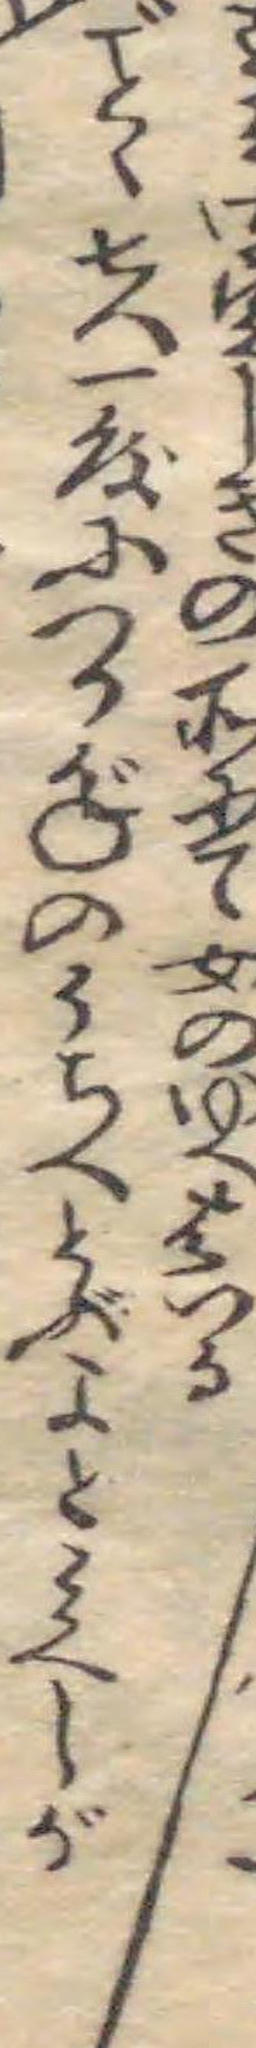ごとく七人一度につりがねのうちへとぶよとみへしが
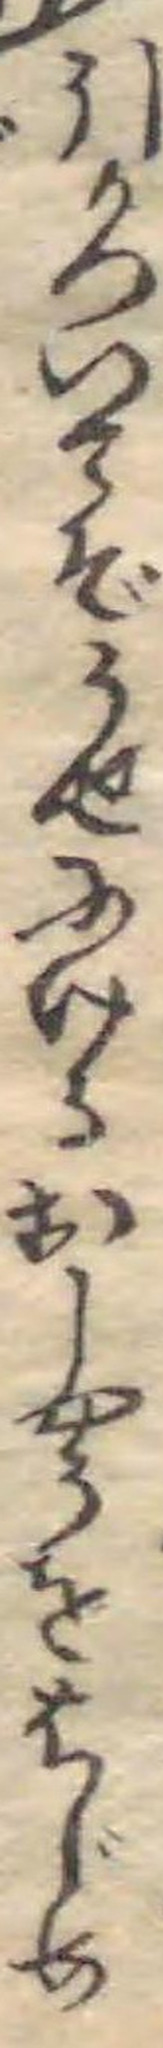引かついてぞうせにけるおしやうをはじめ
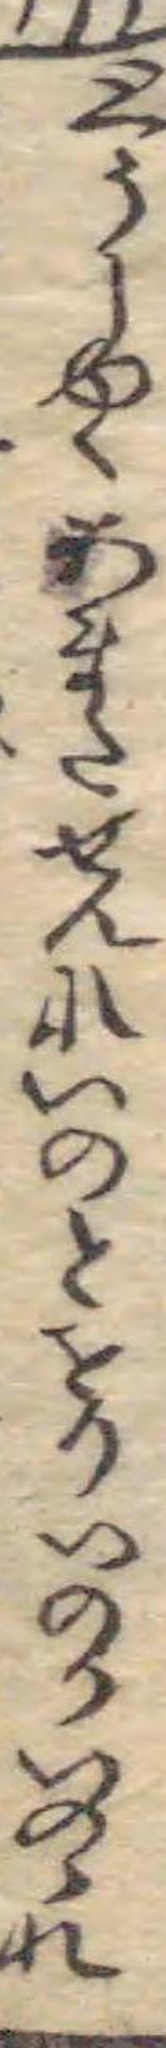どうしゆくあまたせんれいのとをりいのりいのられ
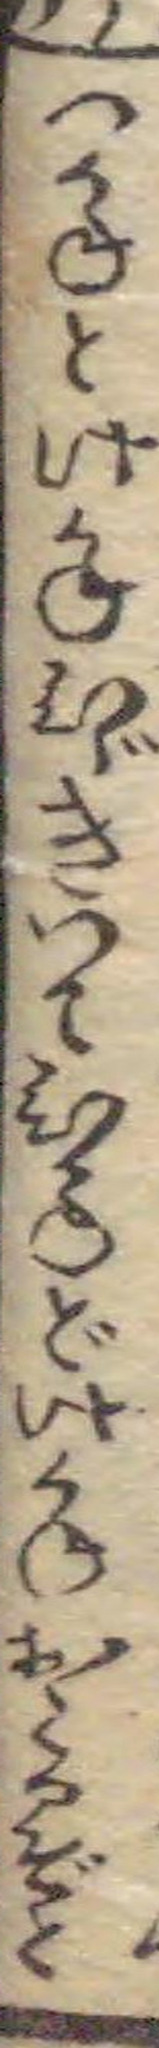つかねと此かねひゞきいてひかねど此かねおこるぞと
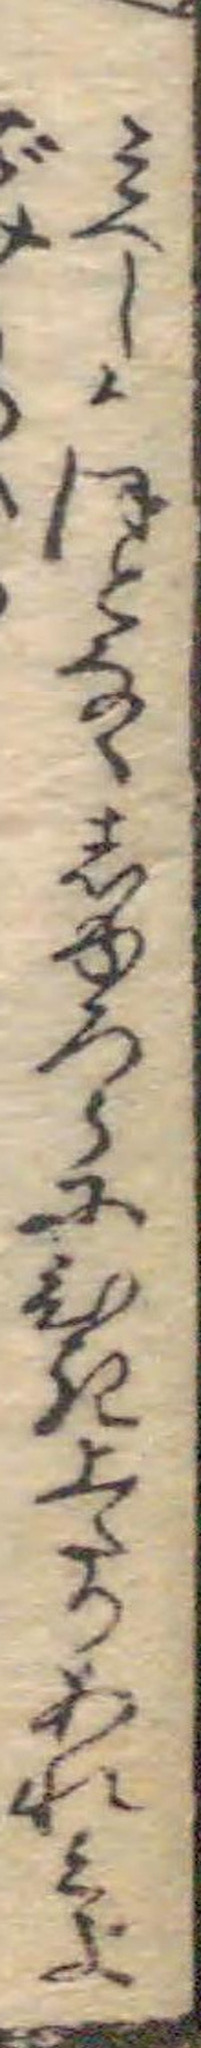みへしかほとなくしゆろうにひき上たりあれとよ
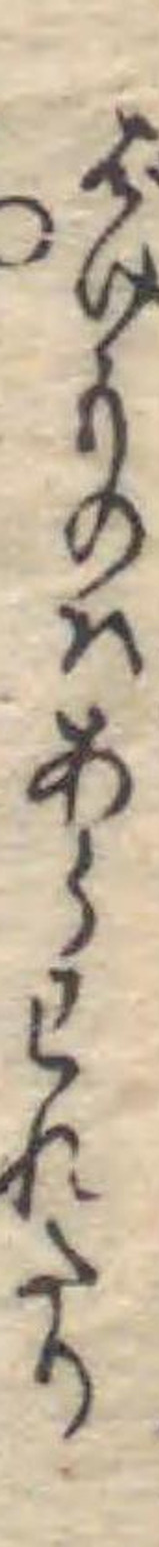ばけものはあらわれたり
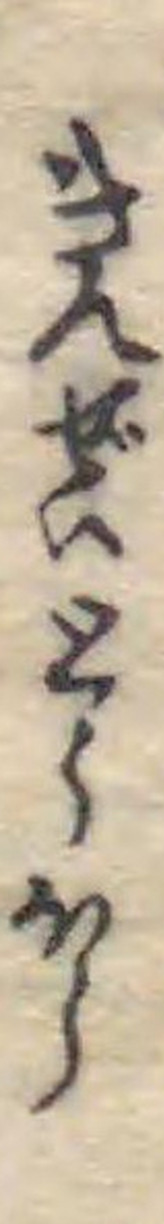きんぜいとうほう
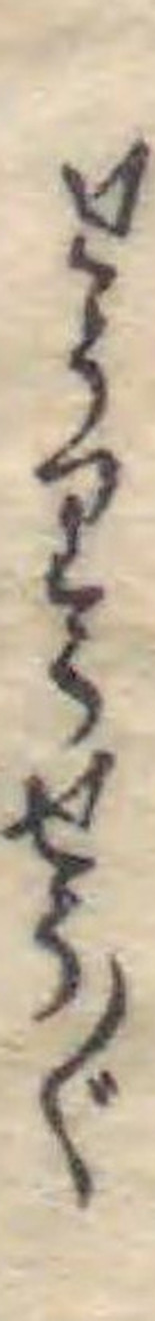せうりうせう〴〵
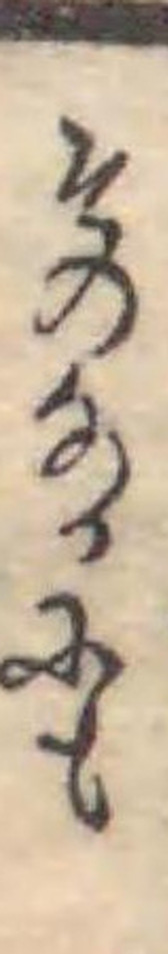そのなかにも
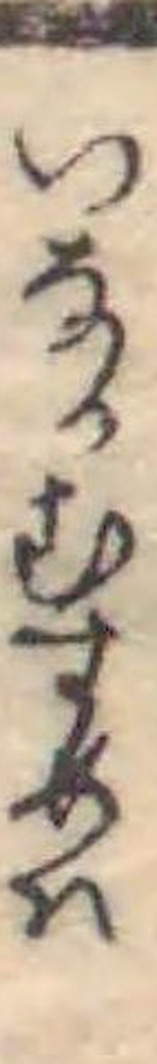いなかむすめは
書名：鐘入七人化粧 : 3巻
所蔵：国立国会図書館 National Diet Library, JAPAN
